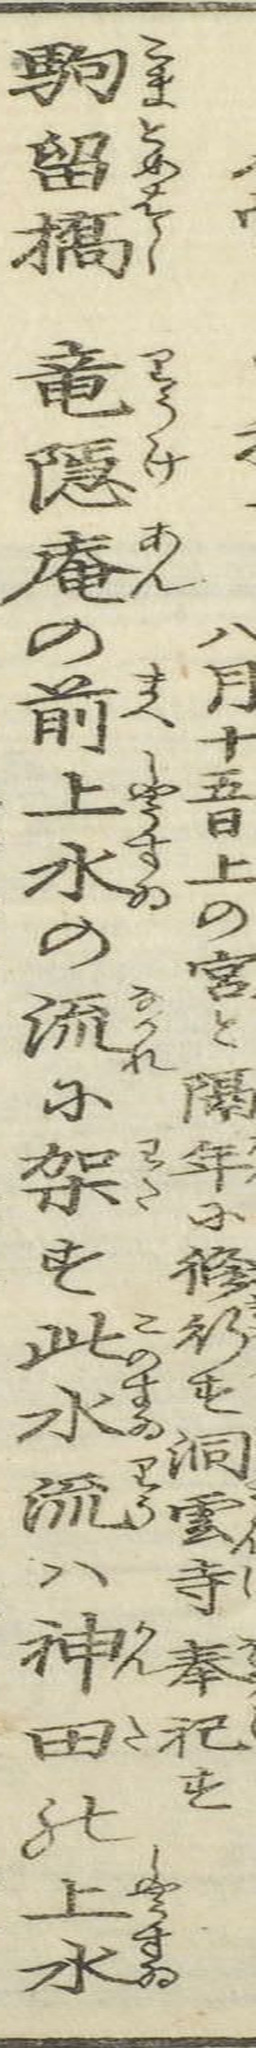駒留橋竜隠庵の前上水の流に架す此水流は神田の上水
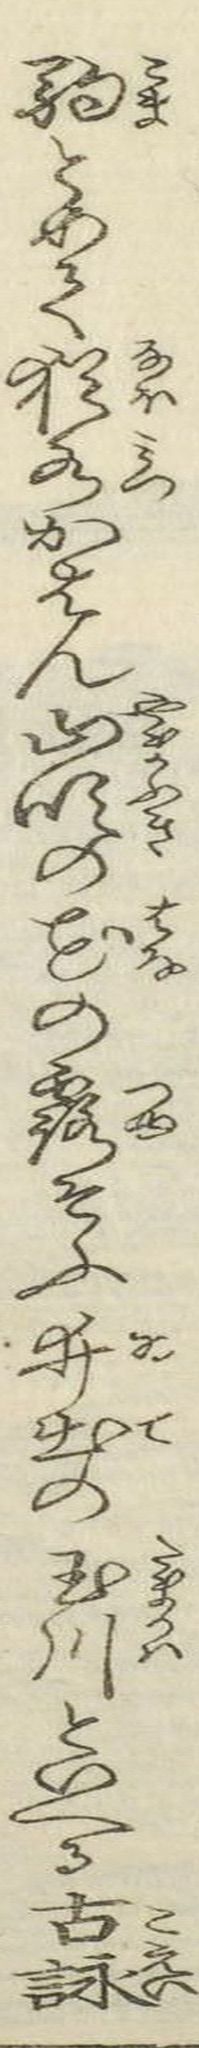駒とめて猶水かはん山吹の花の露そふ井出の玉川といへる古詠
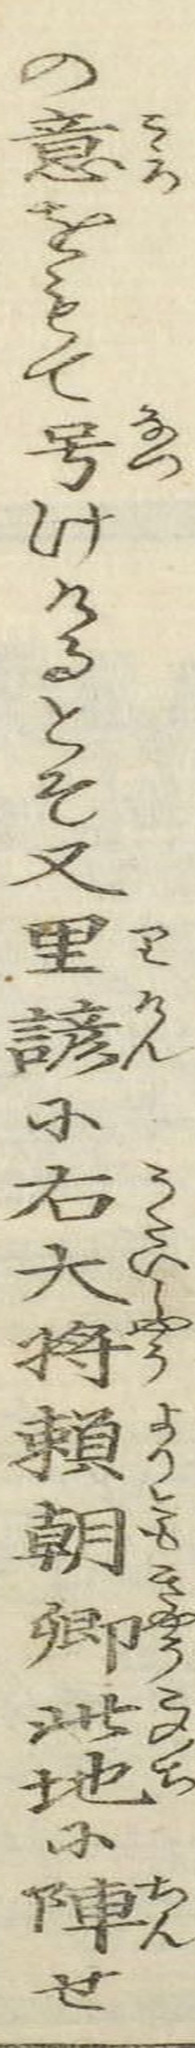の意をもて号けけるとそ又里諺に右大將頼朝卿此地に陣せ
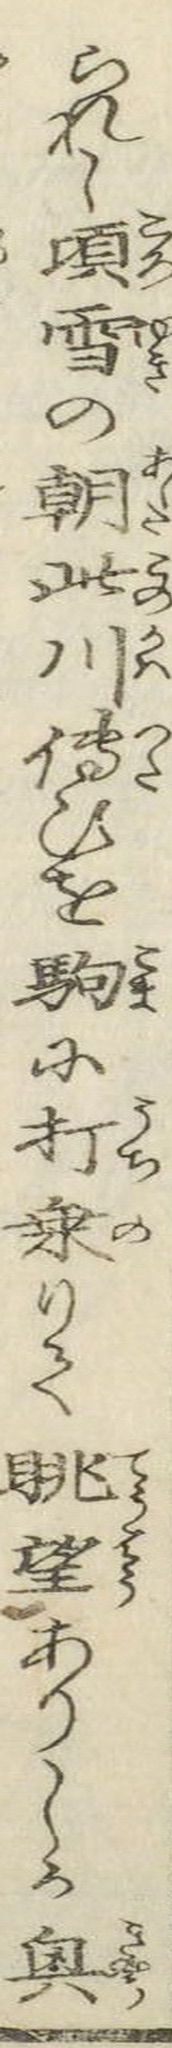られし頃雪の朝此川傳ひを駒に打乗りて眺望ありしか興
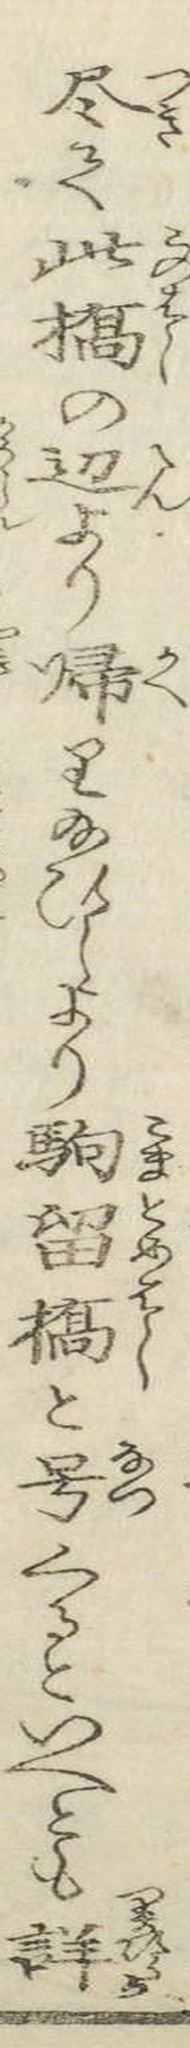尽て此橋の辺より帰り給ひしより駒留橋と号くるといへとも詳
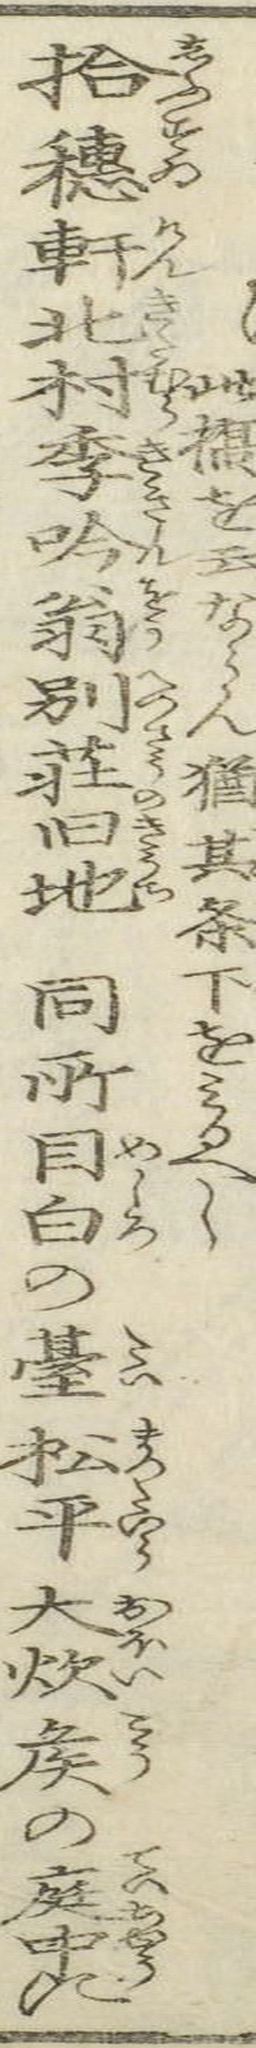拾穂軒北村季吟翁別荘旧地同所目白の臺松平大炊侯の庭中に
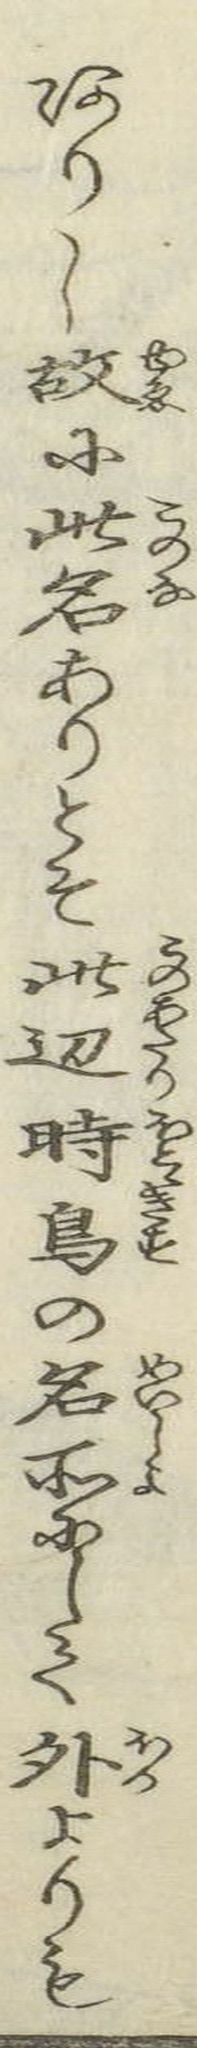ありし故に此名ありとそ此辺時鳥の名所にして外よりも
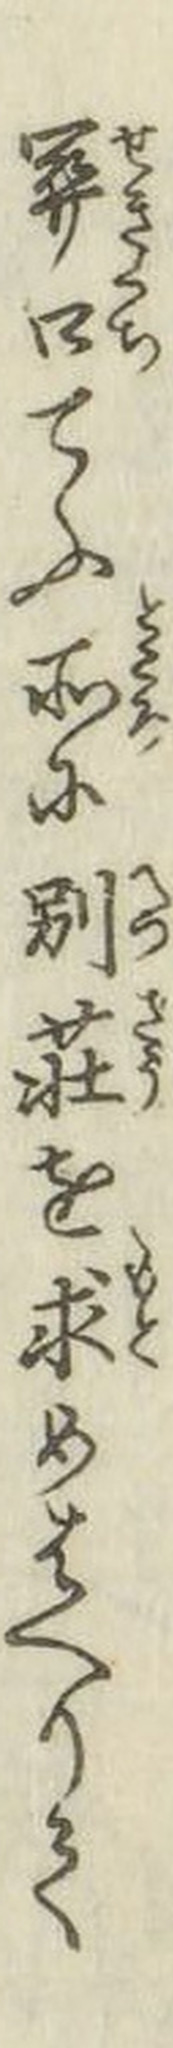関口てふ所に別荘を求めはへりて
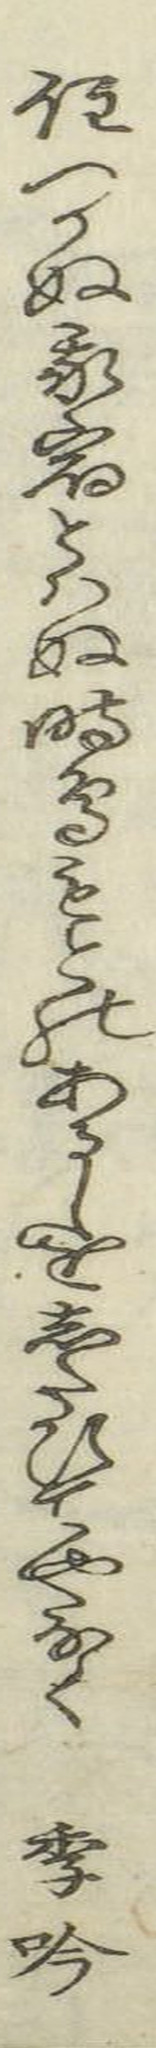住つかぬ我宿とはぬ時鳥もとのあるしをしたひてやなく季吟
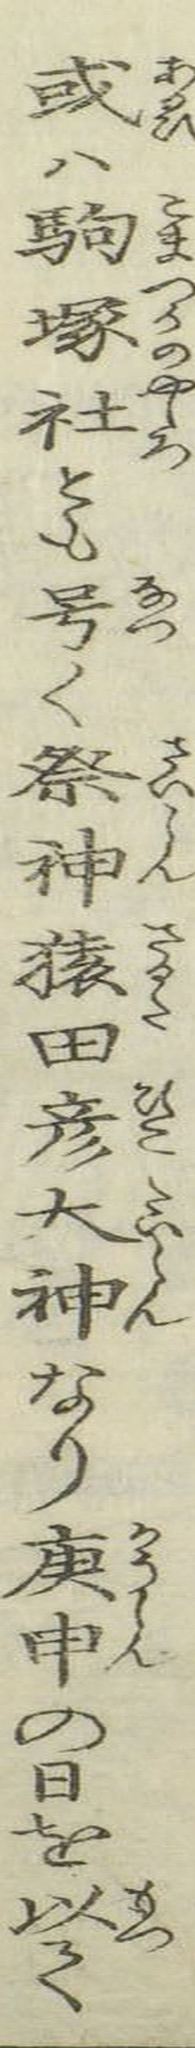或は駒塚社とも号く祭神猿田彦大神なり庚申の日を以て
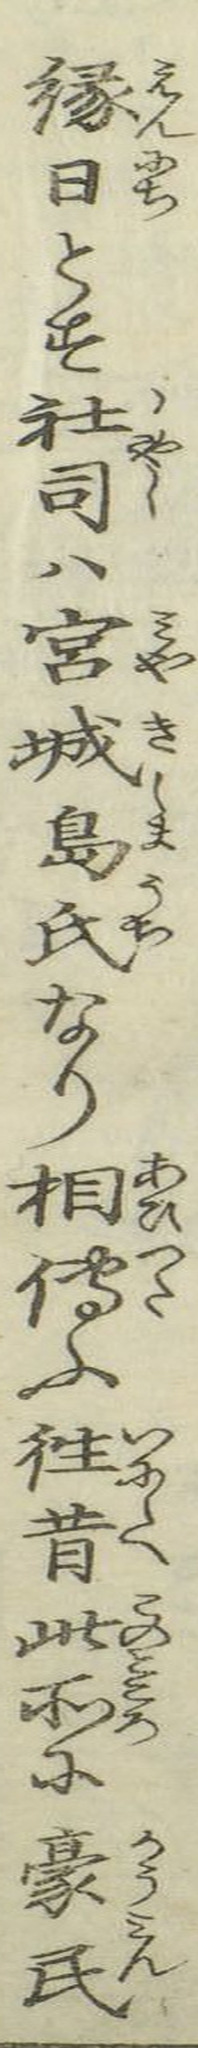縁日とす社司は宮城島氏なり相傳ふ往昔此所に豪民

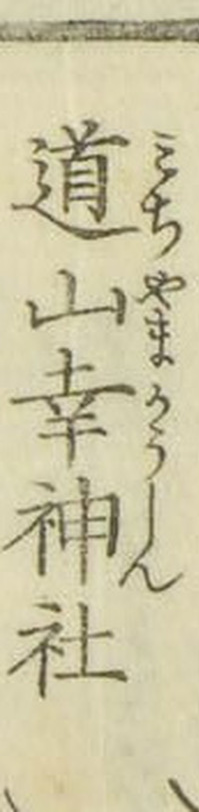道山幸神社
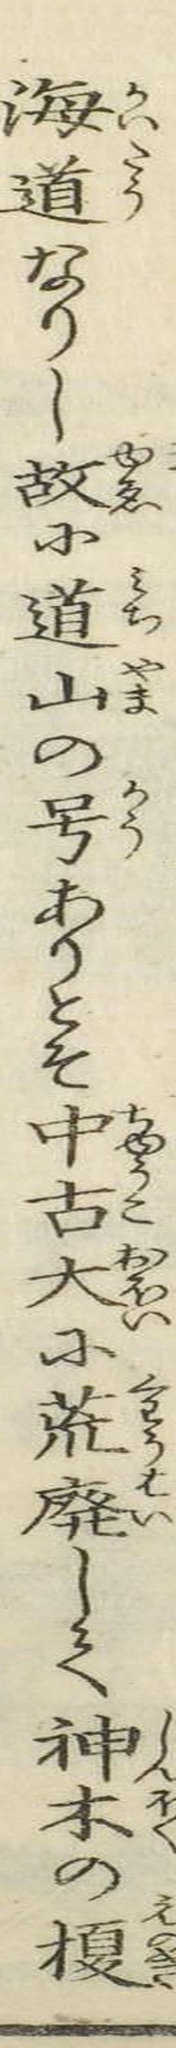海道なりし故に道山の号ありとそ中古大に荒廃して神木の榎
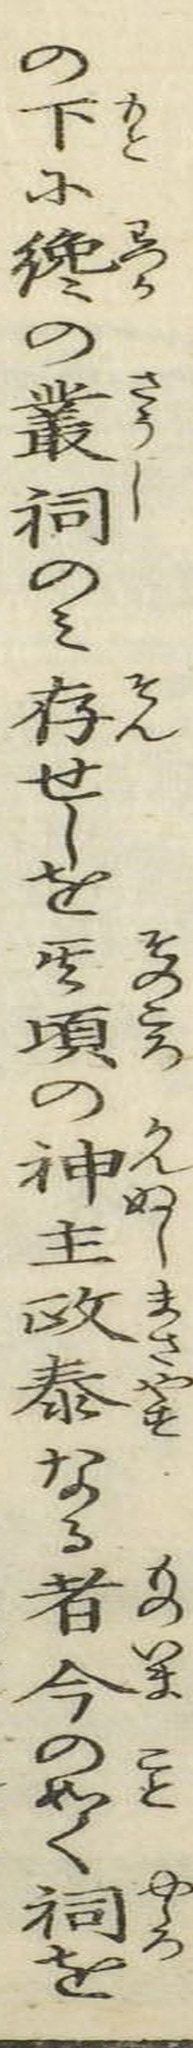の下に纔の叢祠のみ存せしを其頃の神主政泰なる者今の如く祠を
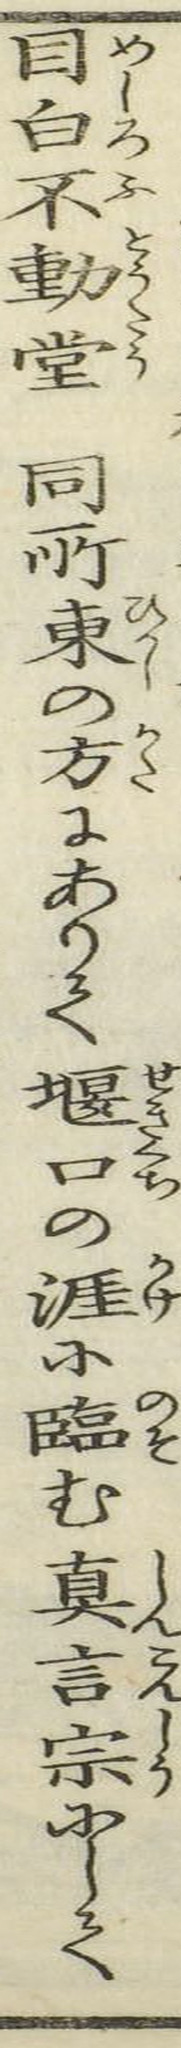目白不動堂同所東の方にありて堰口の涯に臨む真言宗にして
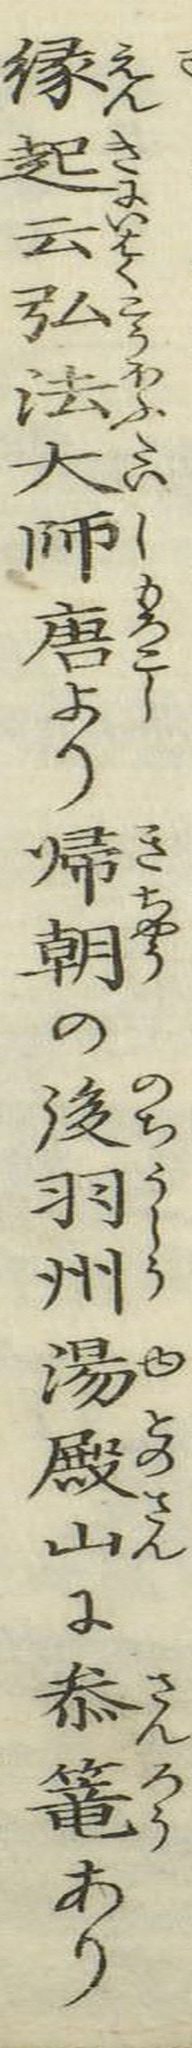縁起云弘法大師唐より帰朝の後羽州湯殿山に参篭あり
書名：江戸名所図会 20巻 巻之12
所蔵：東京学芸大学教育コンテンツアーカイブ
